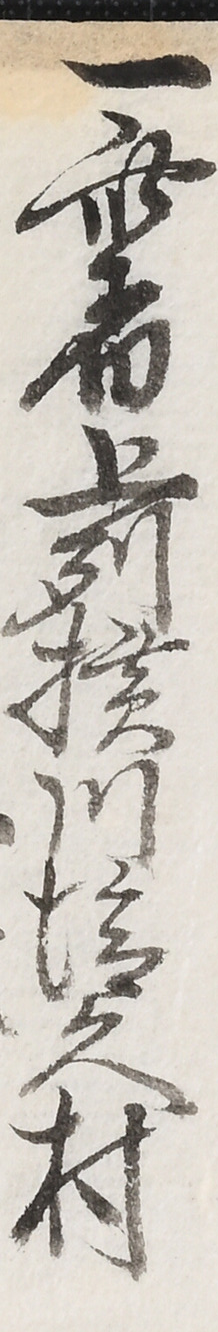一此者上州横川塩久村
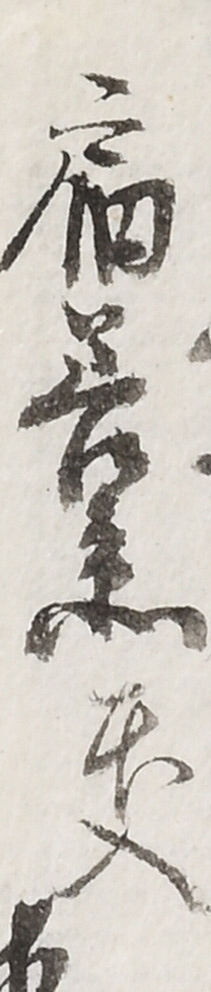宿善兵衛
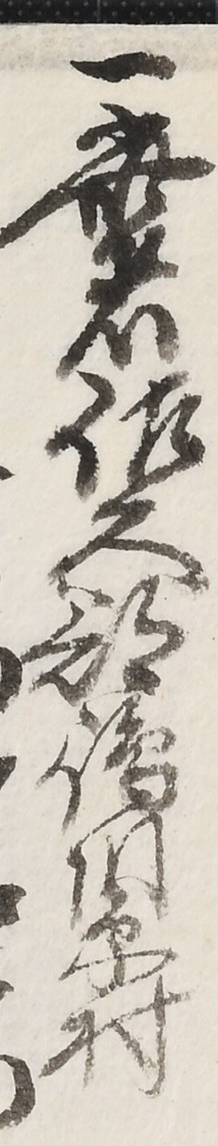一此者佐久郡島川原村
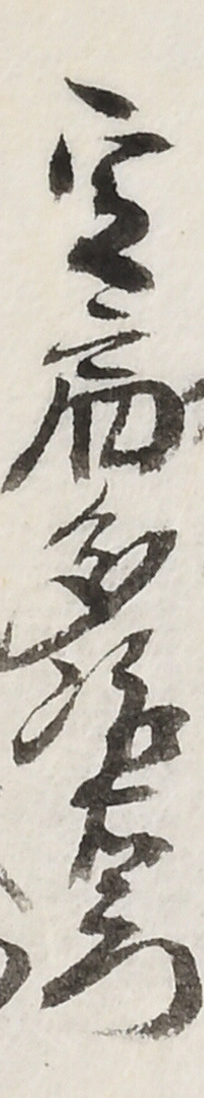定宿多治右衛門
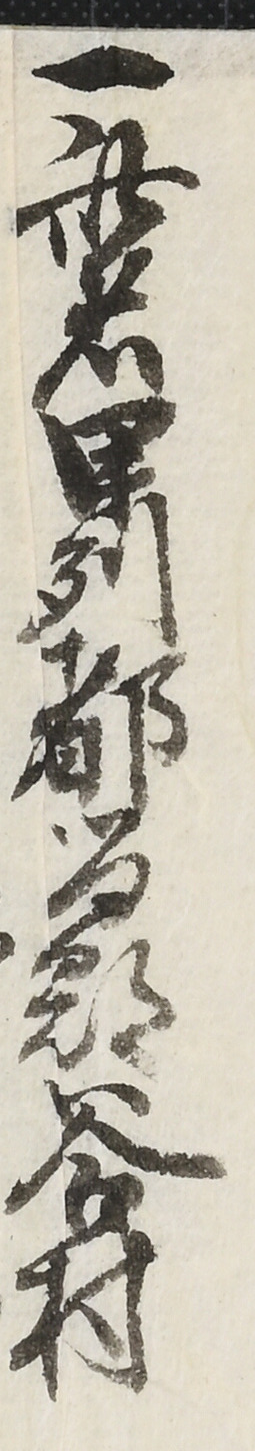一此者甲州都留郡谷村
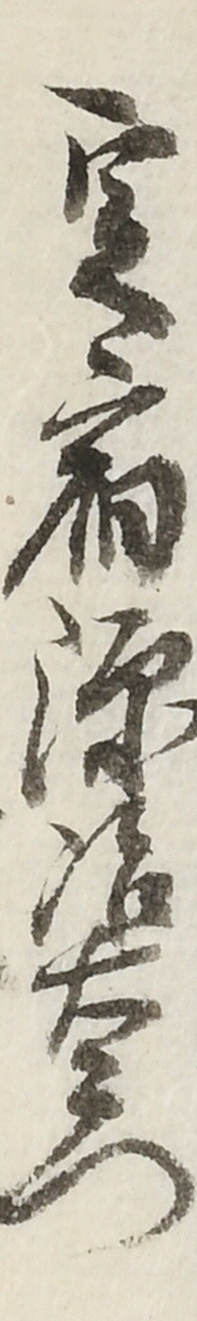定宿源治右衛門
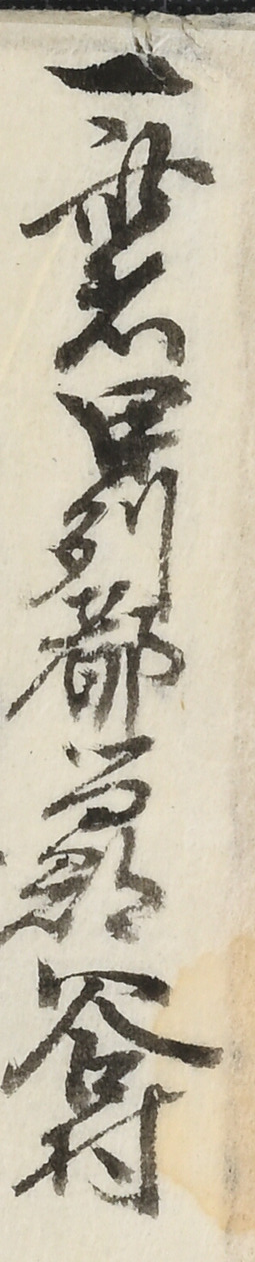一此者甲州都留郡谷村
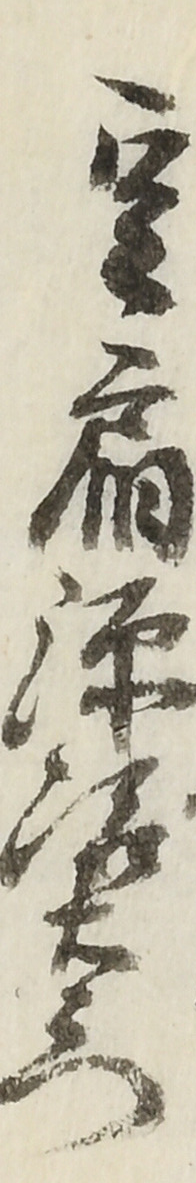定宿源治右衛門

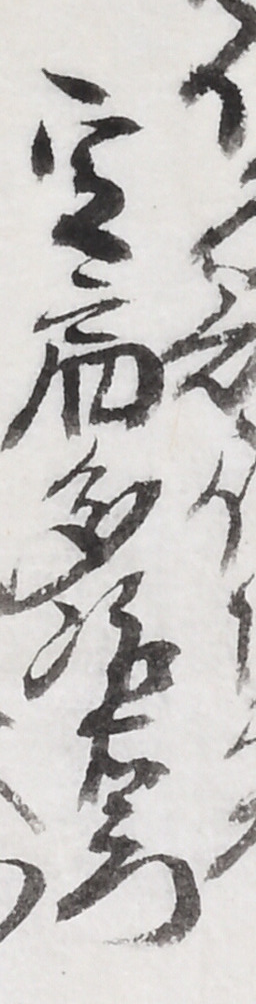定宿多治右衛門
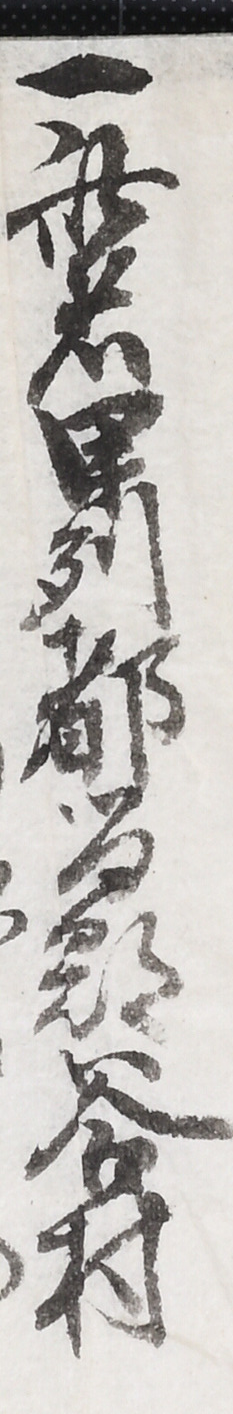一此者甲州都留郡谷村
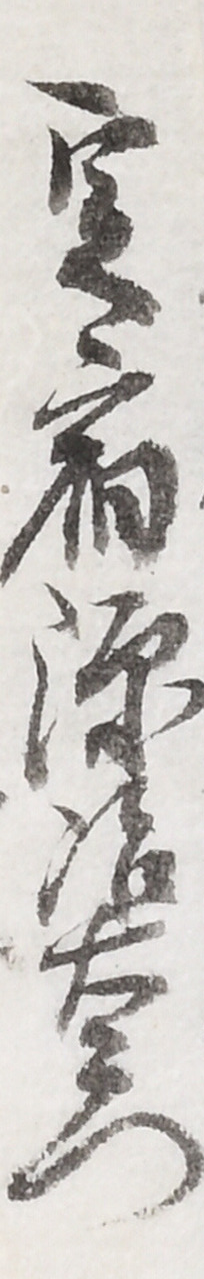定宿源治右衛門
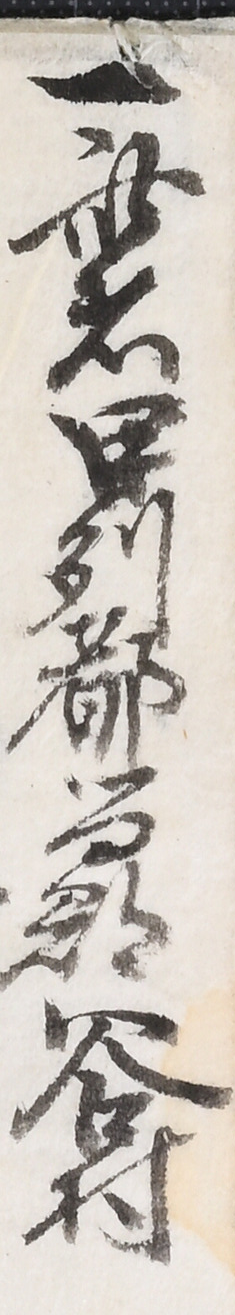一此者甲州都留郡谷村
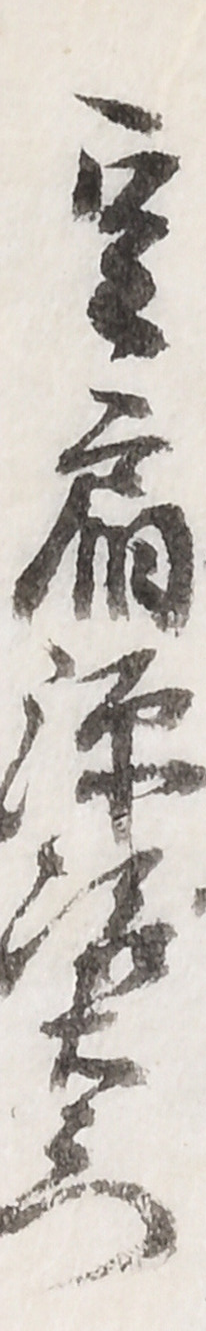定宿源治右衛門
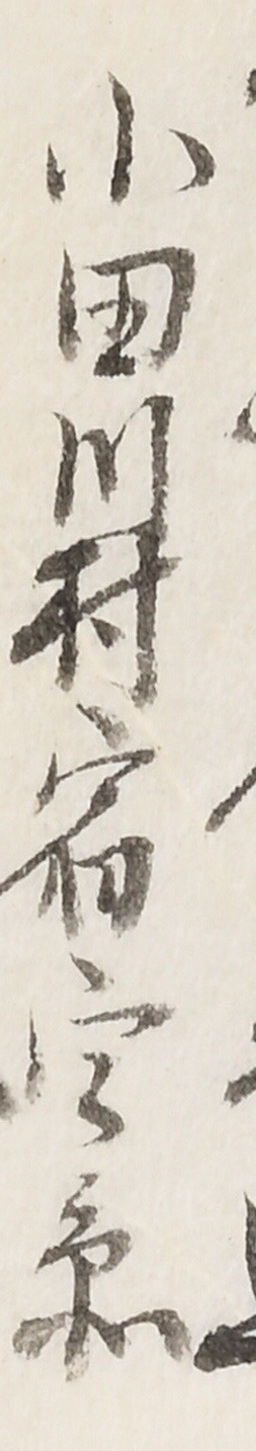小田川村宿宇兵衛
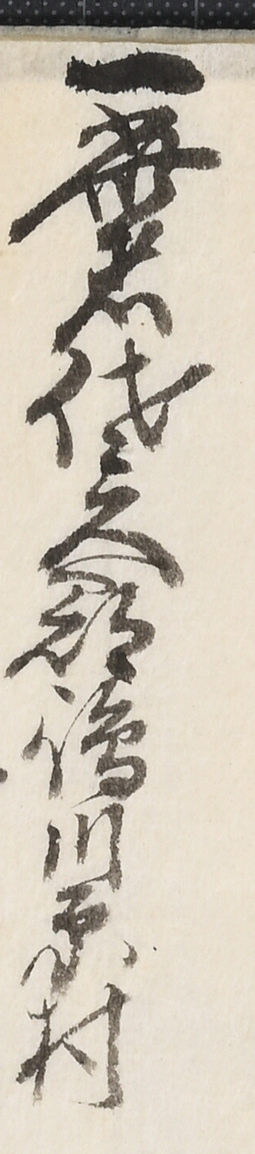一此者佐久郡島川原村
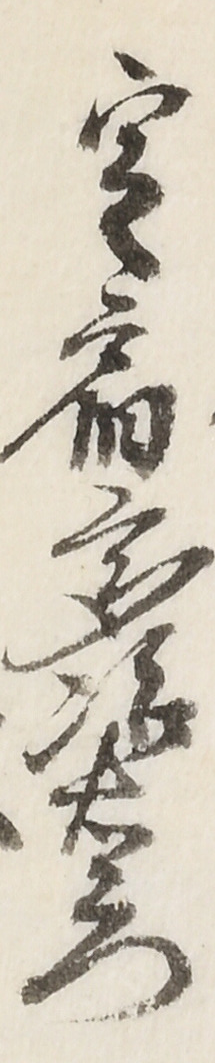定宿源治右衛門
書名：慶應二丙寅年正月吉日他國出石切名前書上帳
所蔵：伊那市立高遠町図書館・合同会社AMANE
